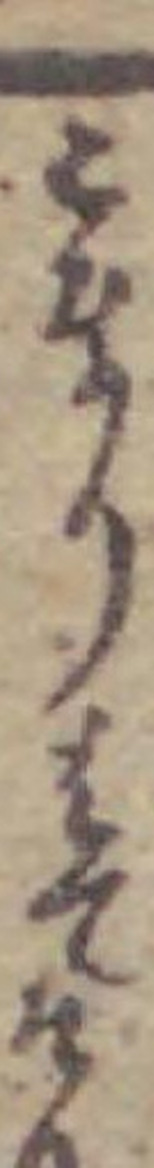こまりはてけり

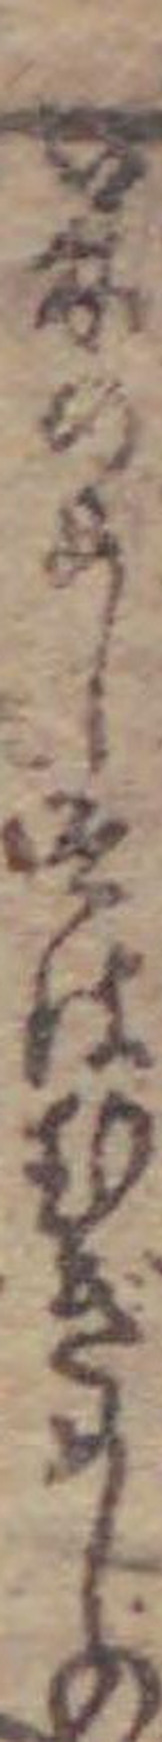米のめしそはむぎめしの
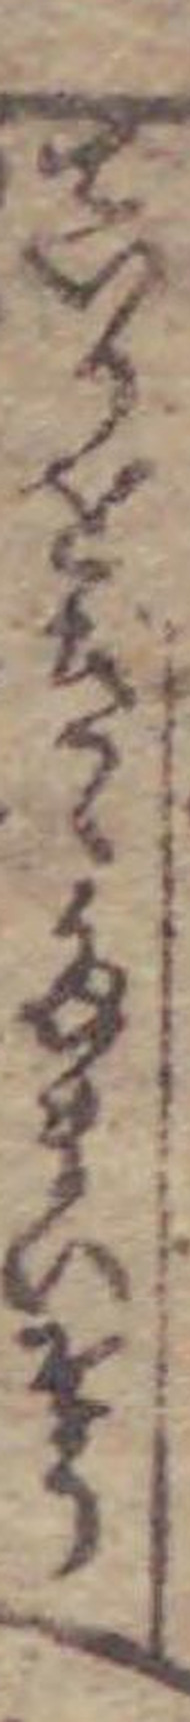ていりをきゝたまいそう
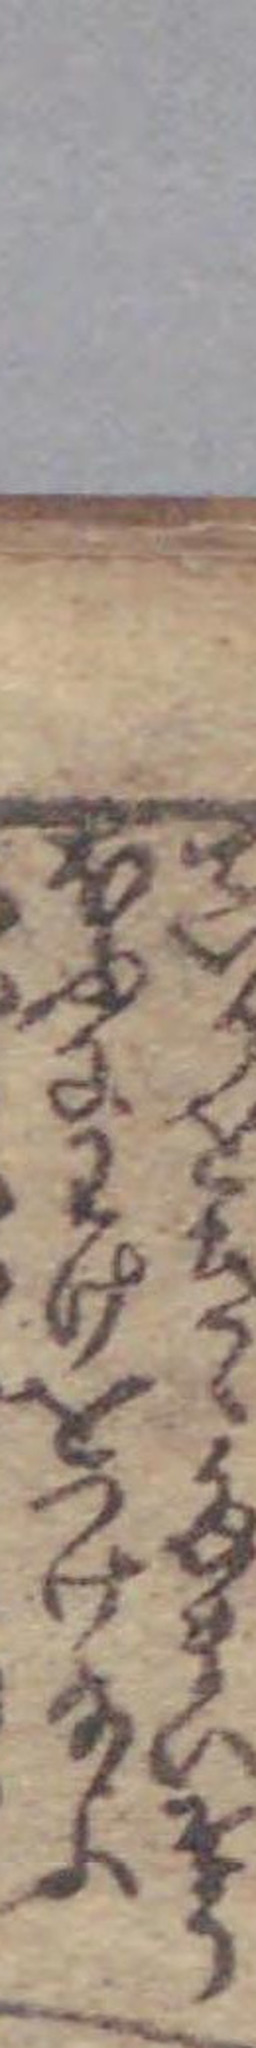ほふにわけをつけ給ふ
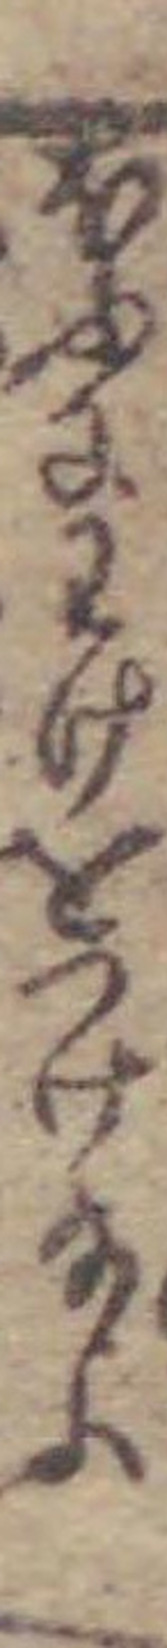ほふにわけをつけ給ふ
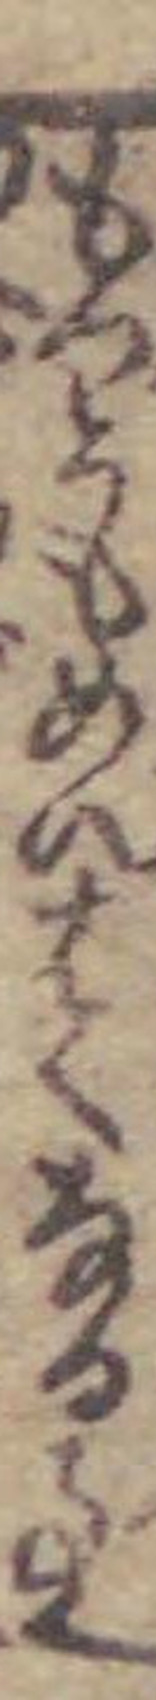もつともめいはくなる事
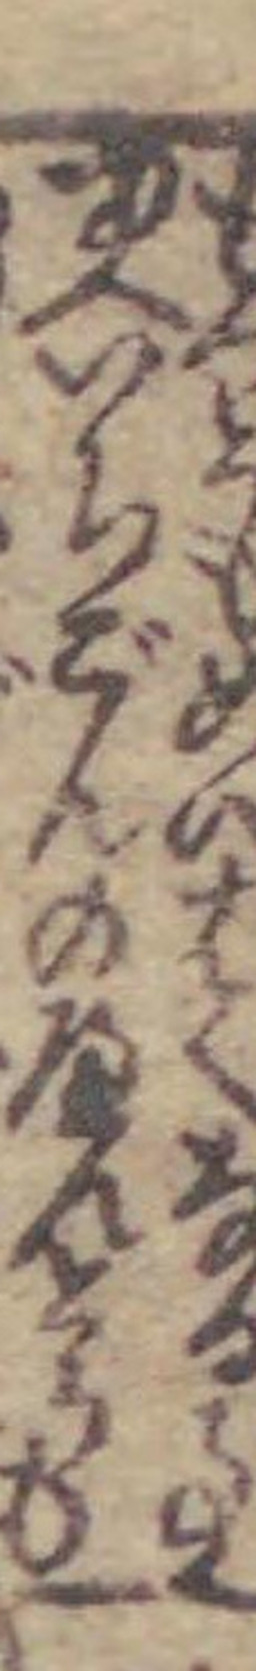ゆへいちごんのへんとうも
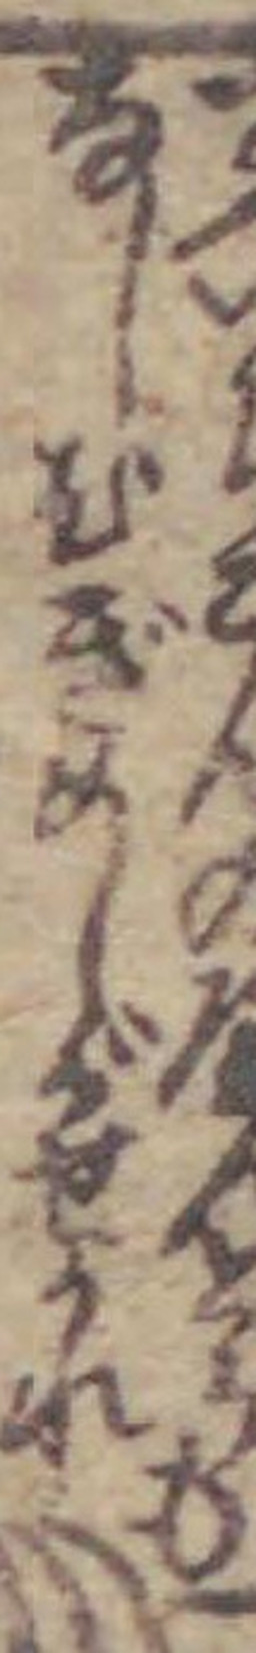なしむぎめしがせかれ
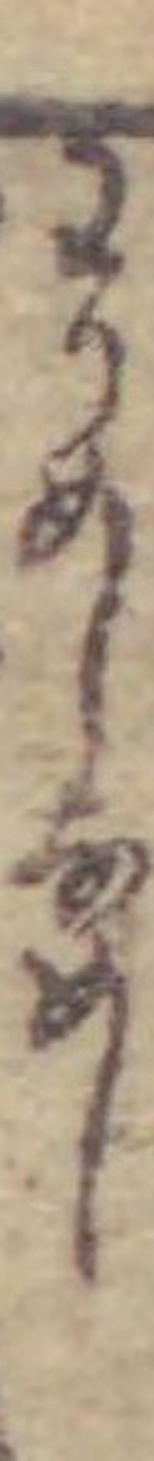わりめしなめし
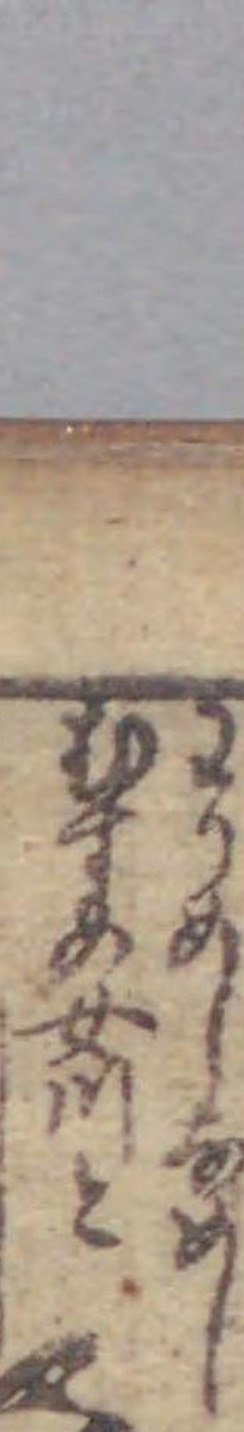むすめ女川と
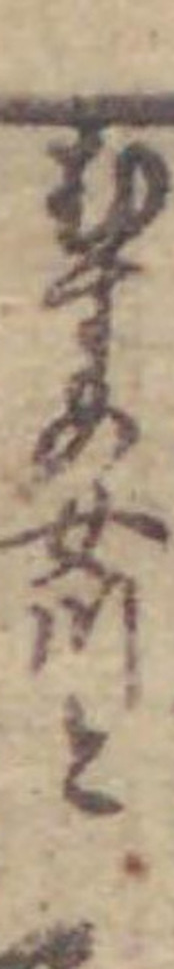むすめ女川と
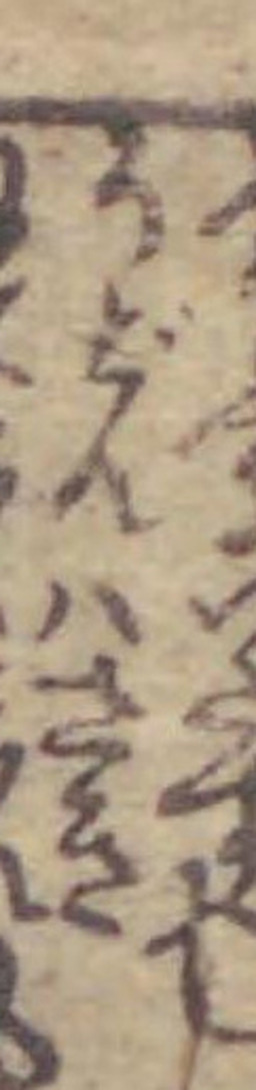うどんはさき
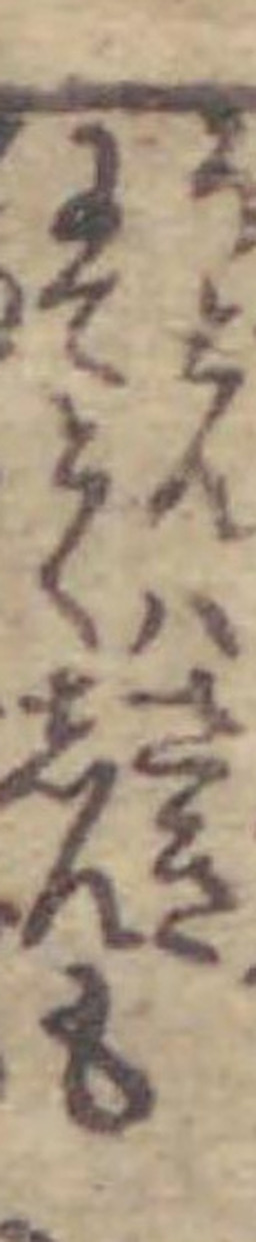にてとくしんも
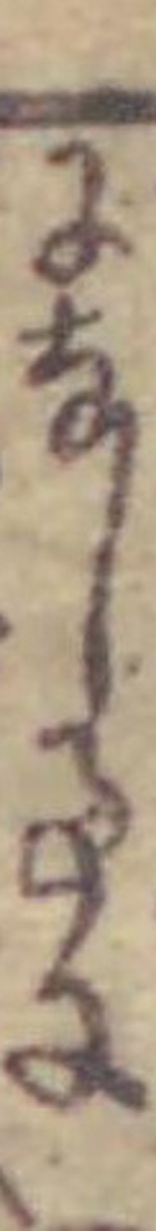になし事に
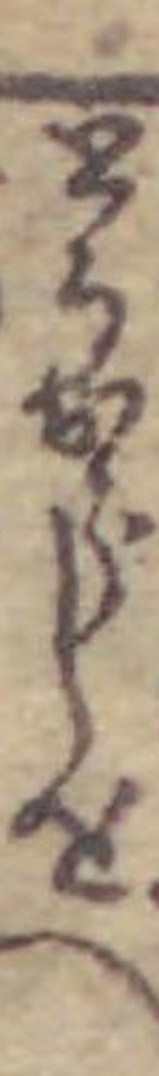とうからしを
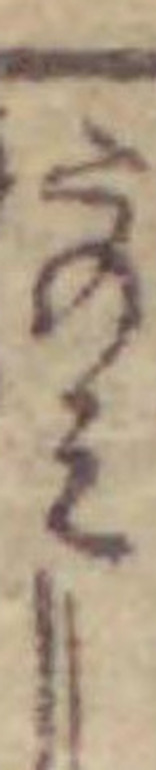たのみ
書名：諸事米の飯 : 3巻
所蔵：国立国会図書館 National Diet Library, JAPAN
